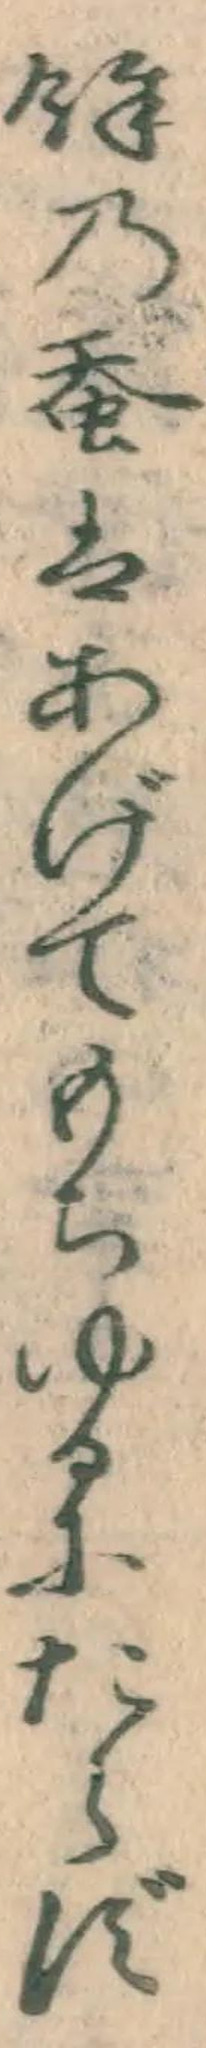余の蚕はあげてもちゆるにたらず
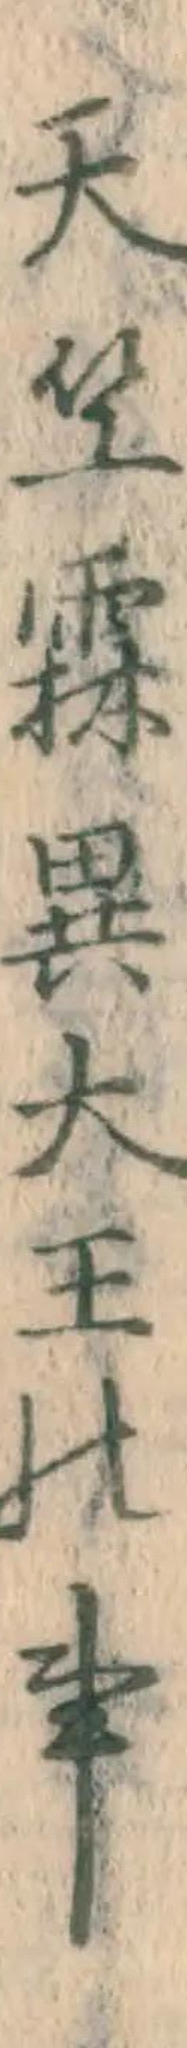天竺霖異大王の事
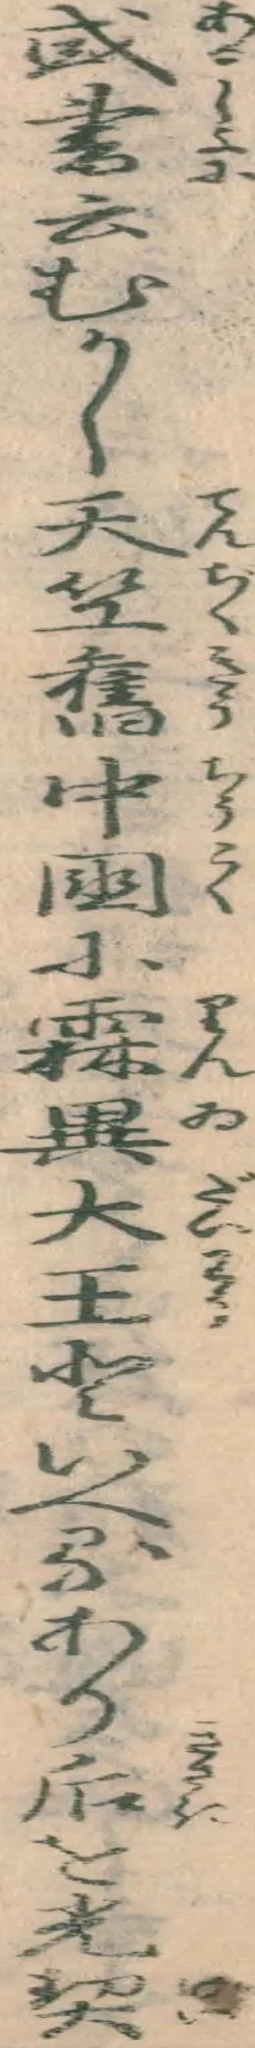或書云むかし天竺旧中国に霖異大王といへるあり后を光契
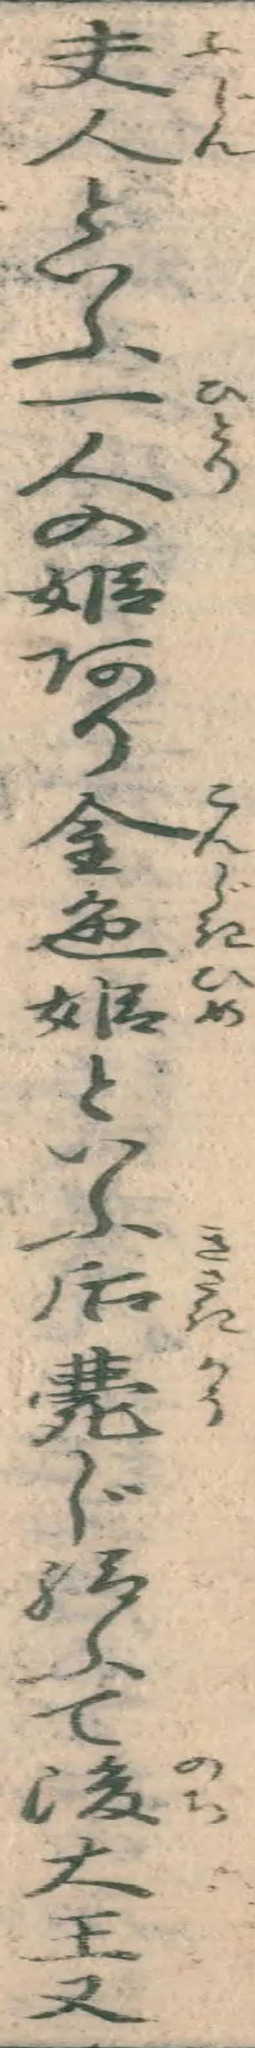夫人といふ一人の姫あり金色姫といふ后薨じ給ふて後大王又
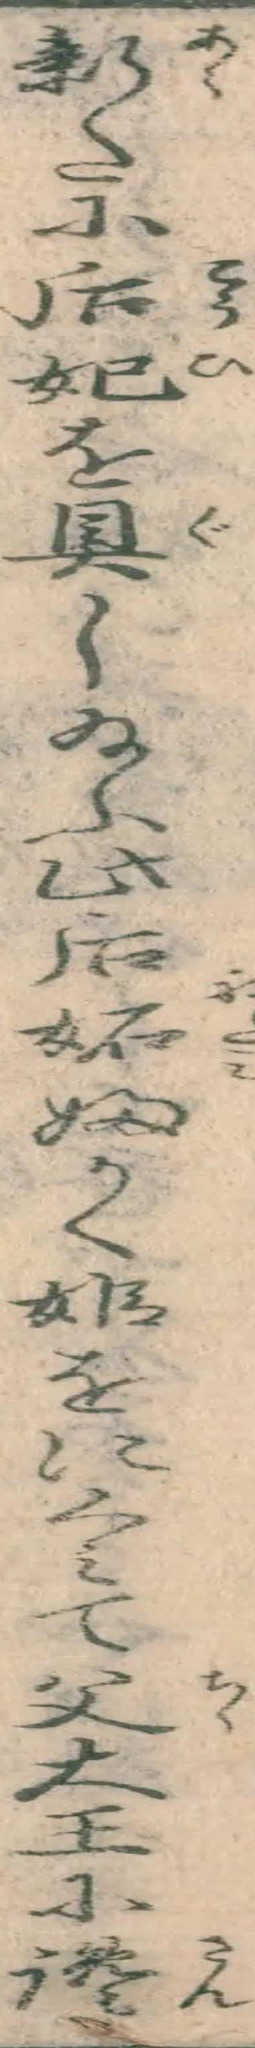新たに后妃を具し給ふ此后妬ふかく姫をにくみて父大王に讒
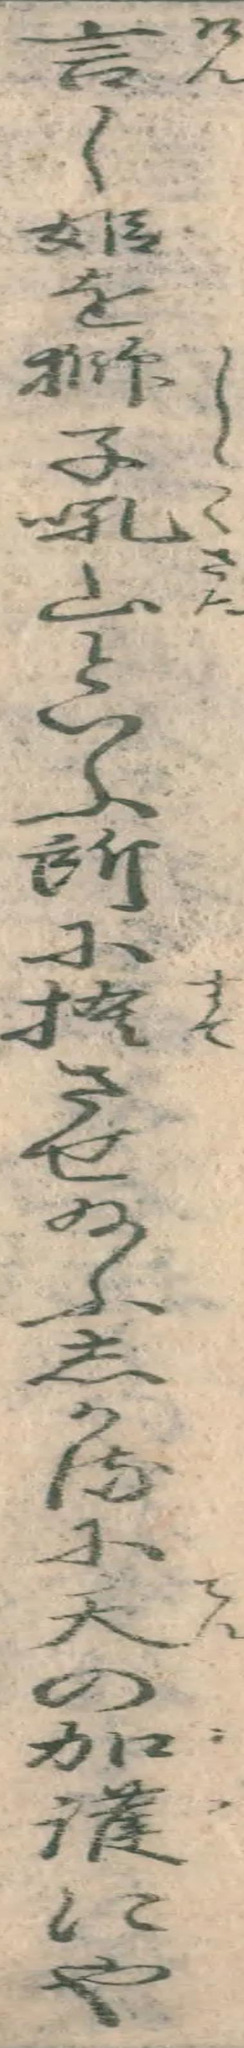言し姫を獅子吼山といふ所に捨させ給ふしかるに天の加護にや
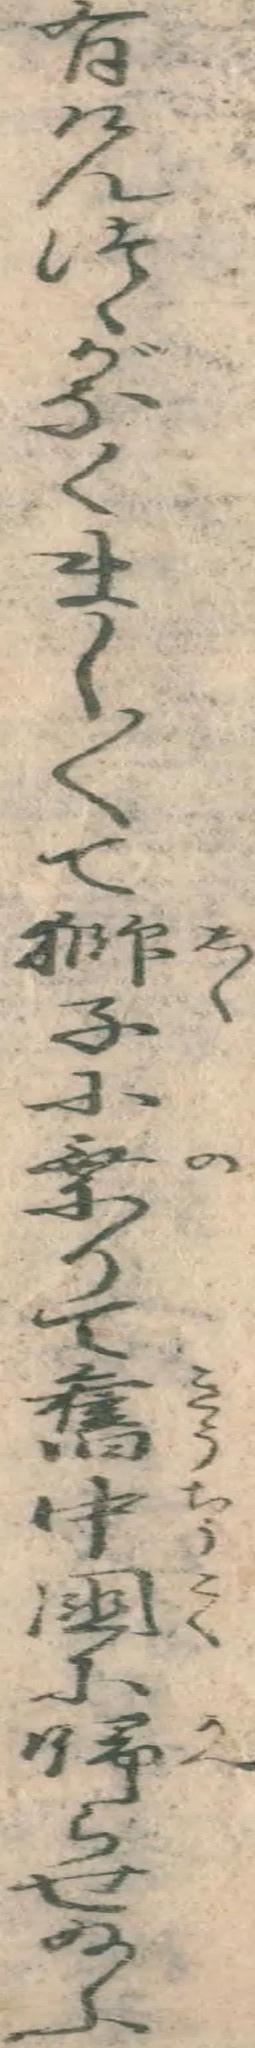有けんつゝがなくまし〳〵て獅子に乗りて旧中国に帰らせ給ふ
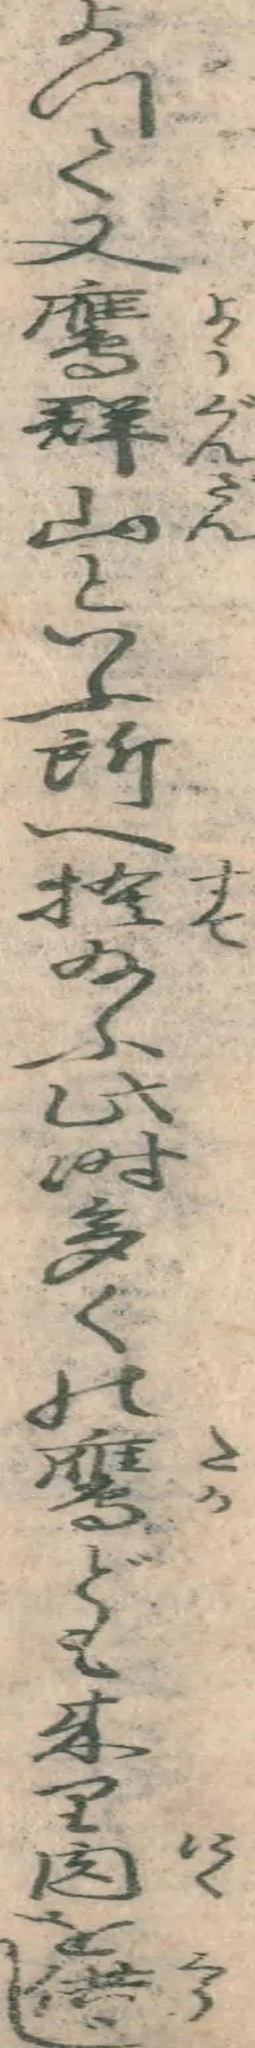よって又鷹群山といふ所へ捨給ふ此時多くの鷹ども来り肉を供じ
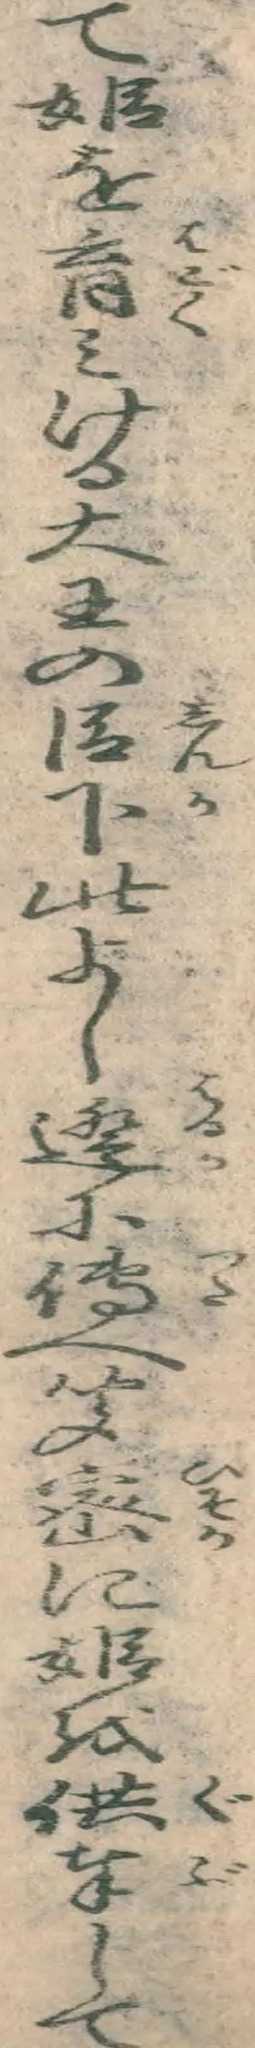て姫を育みける大王の臣下此よし遙に伝へ聞密に姫を供奉して
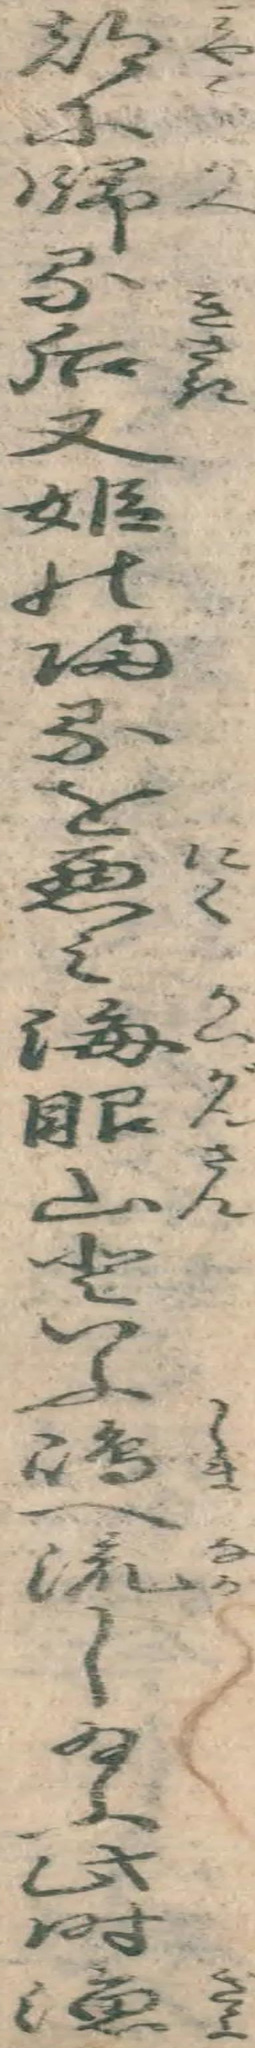都に帰る后又姫の帰るを悪み海眼山といふ島へ流し給ふ此時漁

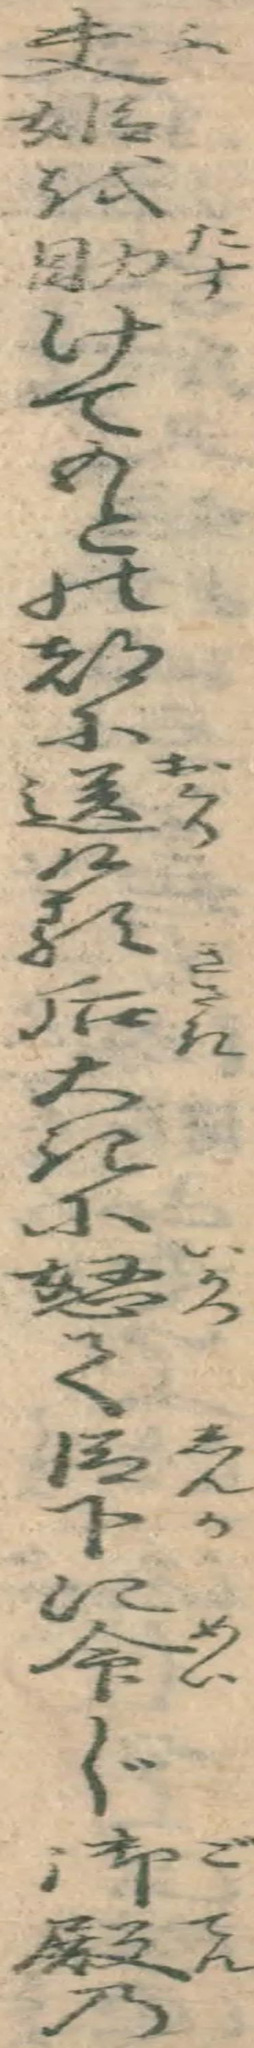夫姫を助けてもとの都に送ける后大きに怒て臣下に命じ御殿の
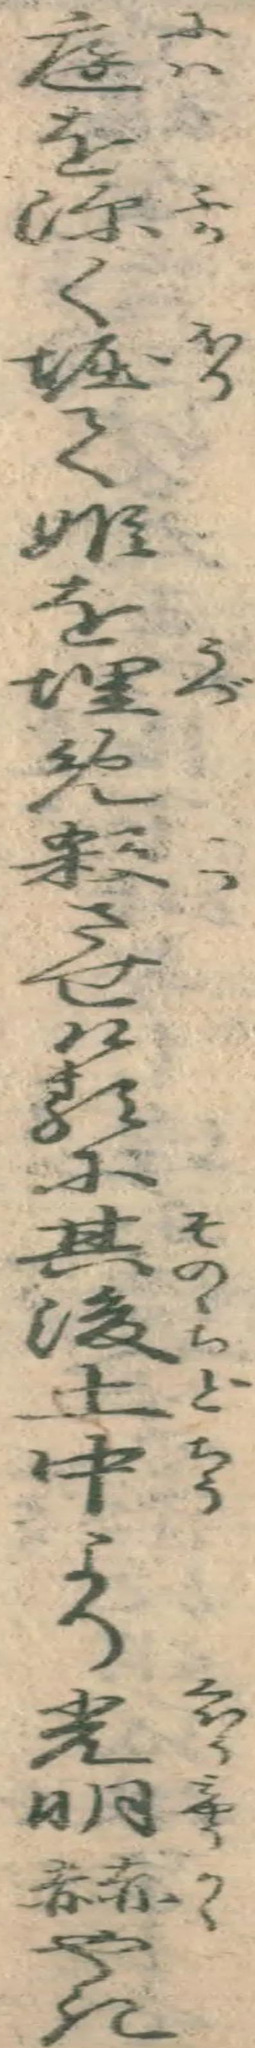庭を深く堀て姫を埋め殺させけるに其後土中より光明赫やき
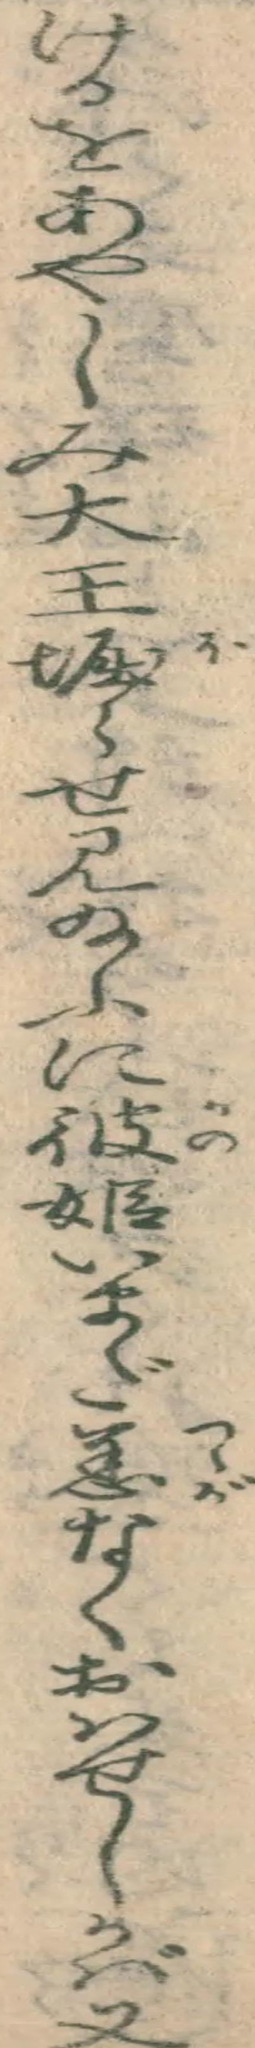けるをあやしみ大王堀らせ見給ふに彼姫いまだ恙なくおはせしかば又
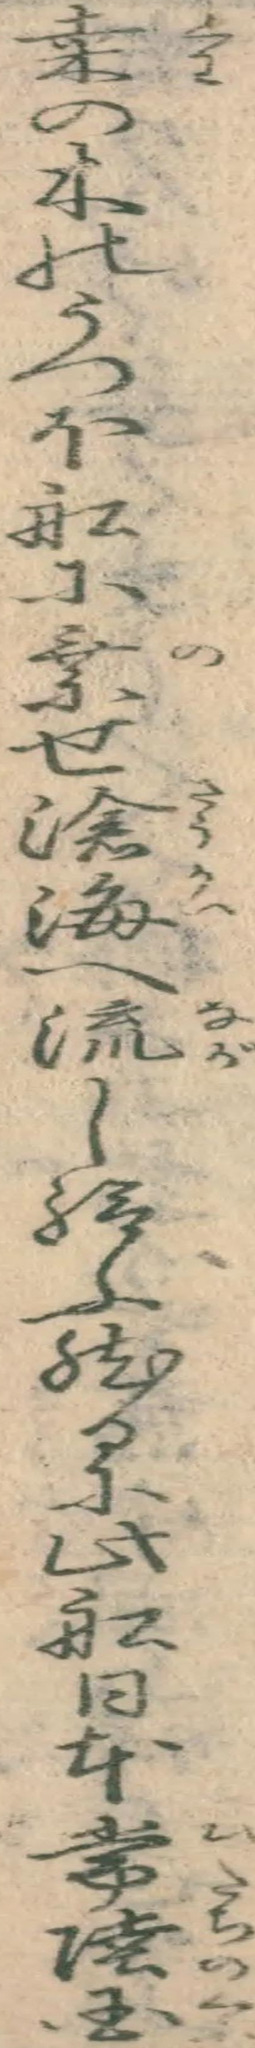桑の木のうつほ船に乗せ滄海へ流し給ふ然るに此船日本常陸国
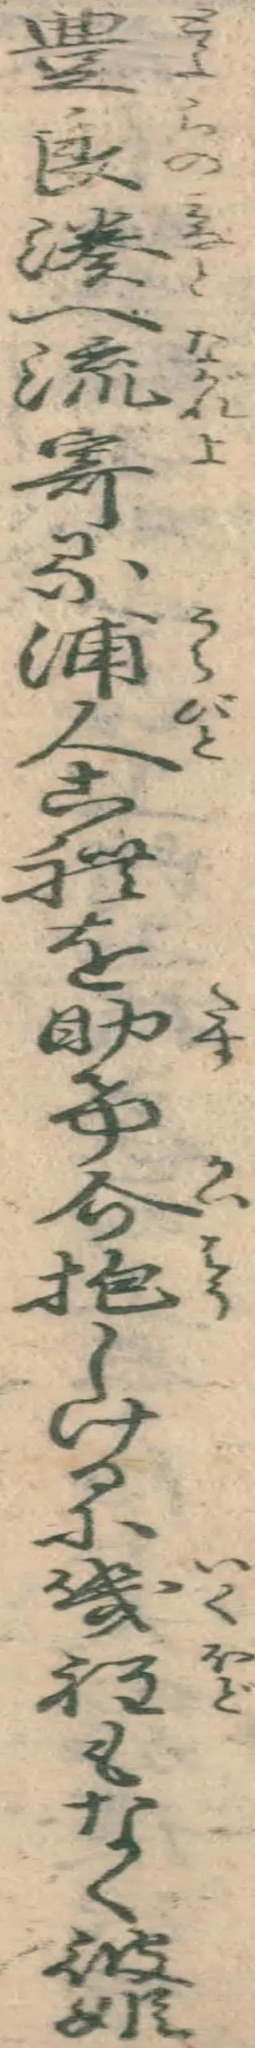豊良湊へ流寄る浦人これを助け介抱しけるに幾程もなく彼姫
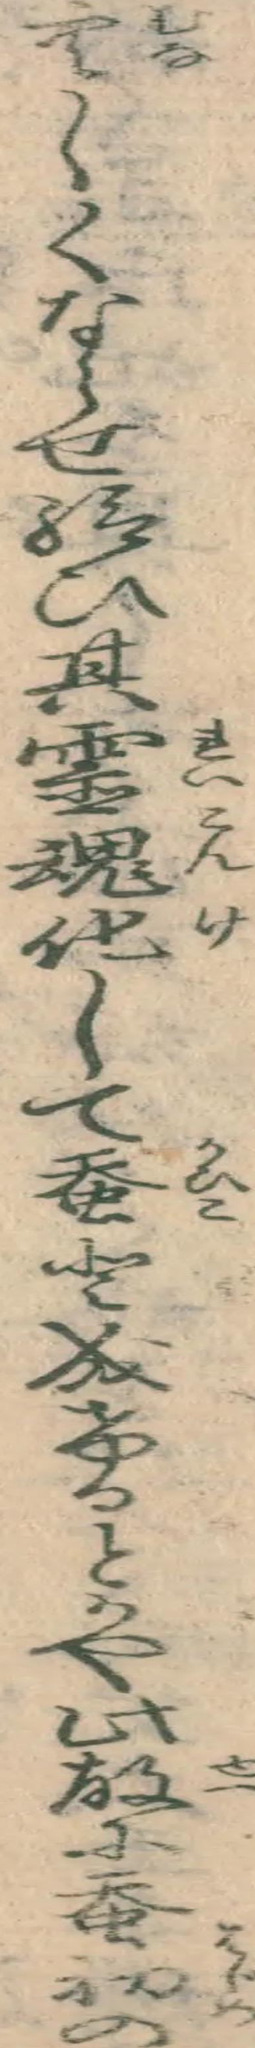空しくならせ給ひ其霊魂化して蚕と成けるとかや此故に蚕初の
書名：養蚕秘録 3巻. [1]
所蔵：国立国会図書館 National Diet Library, JAPAN
